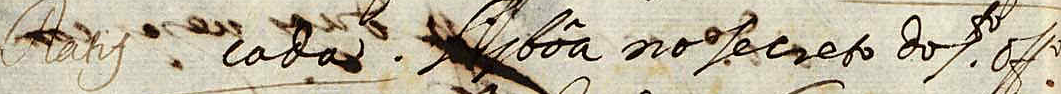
cada. Lisbôa no secreto do s.to off.o
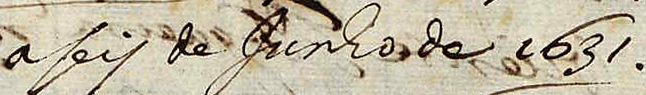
a seis de Junho de 1631.
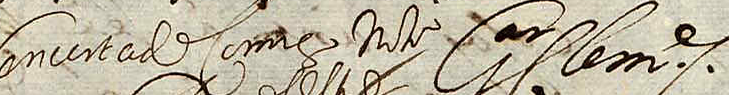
Concertado Comigo not.ro Gaspar Clemente
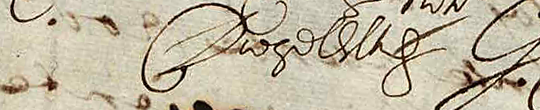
Diogo Velho
